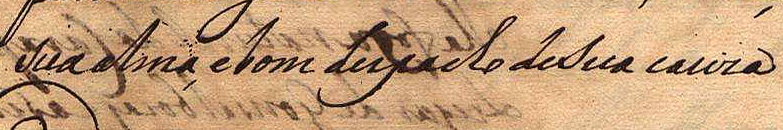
sua alma, e bom despacho de Sua cauza
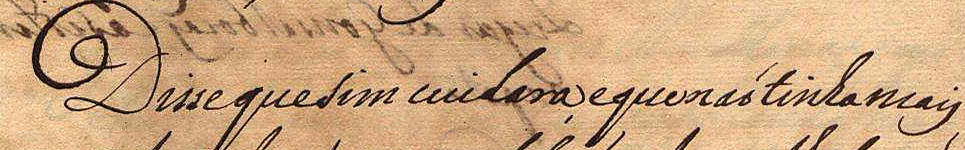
Disse que sim cuidara, e que naõ tinha mais
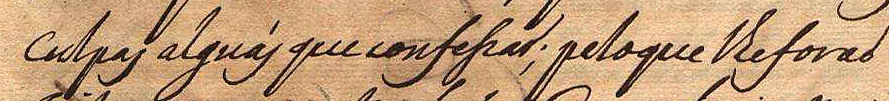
culpas alguās que confessar; pelo que lhe foraõ
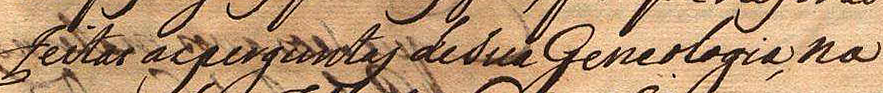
feitas as perguntas de Sua Geneologia, na
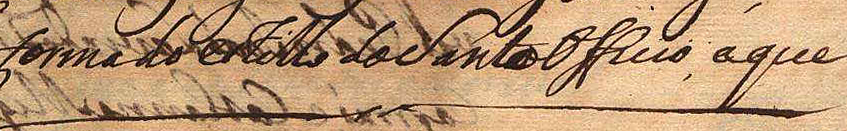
forma do estillo do Santo Officio, a que
